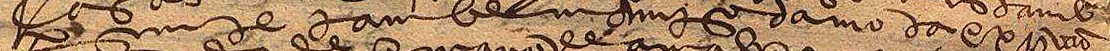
ꝑsemte tambem Amto da mota e xpvaõ
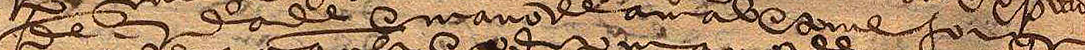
de cjdade e manoell amado e tome Jorge
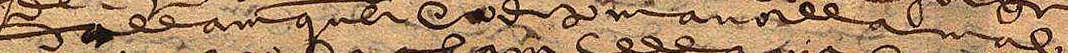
dallamquer e o dito manoell amado
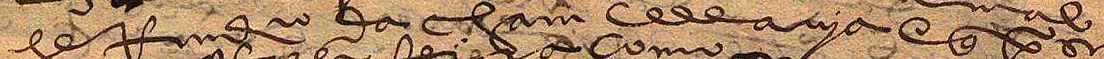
he Rendro da chamcellarya e q̄ p̄o se
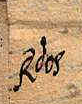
Rdos
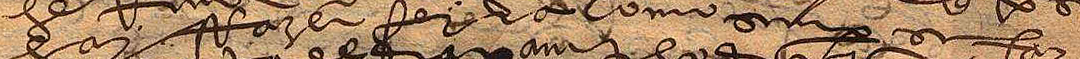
haj ffazer fejra como semꝑ se faz
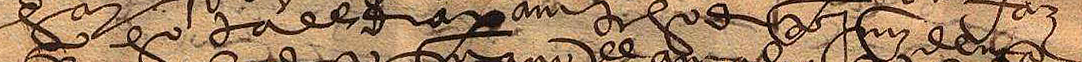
p̄o ho tall dia ꝑamte ho dito Juiz demā
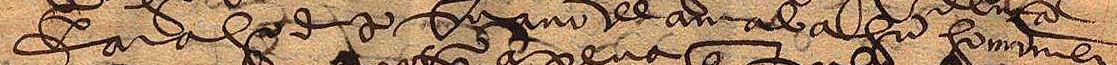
dara ho dito manoell amado a hū homē mer
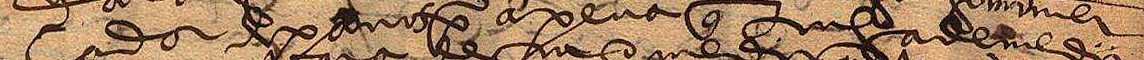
cador de panos p̄o a pena q̄ tinha de medir
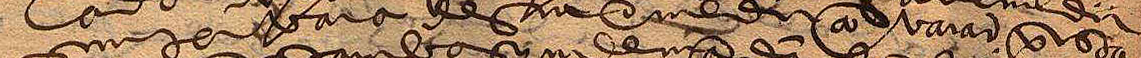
sem ter vara de seu e medir c̄o vara ēp̄esta
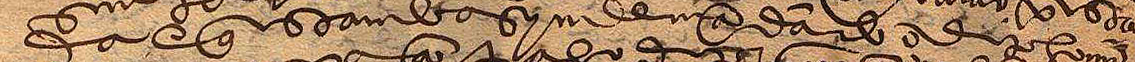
da e q̄ estando asym demādādo o dito homē
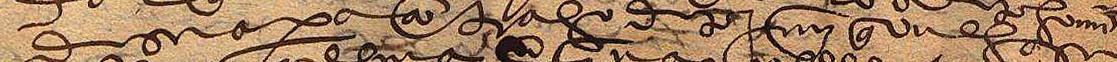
disera ꝑa c̄otra ho dito Juiz q̄ oulhase
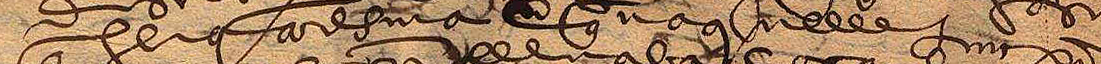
q̄ hera coresma e q̄ naquelle tempo
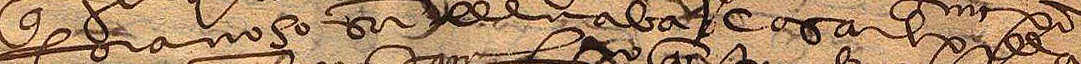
fora noso s̄or lleuado a casa de pilla
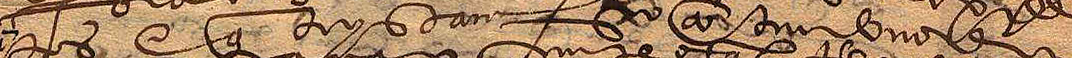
tos e q̄ trystam frco c̄oteudo no dito
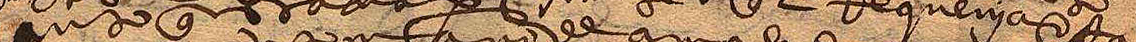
auto q̄ estaua ꝑsemte o q̄l Requerya ē fa
